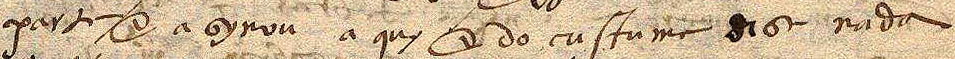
parte e asynou aquy e do custume dise nada
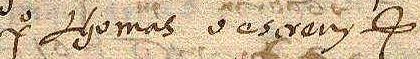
po thomas o escreuy
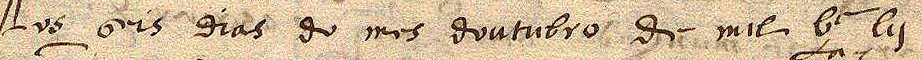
Aos seis dias do mes doutubro de mil bc lij
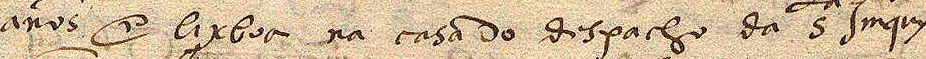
an̅os e̅ lixboa na casa do despacho da sta Jmquy
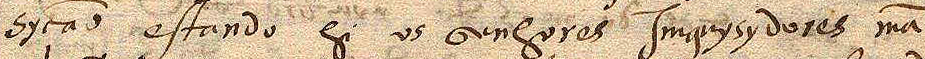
syção estando hi os senhores Jmquysidores m̅a
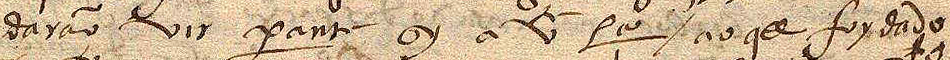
darão vir ꝑante sy a vte Lço / ao qll foy dado
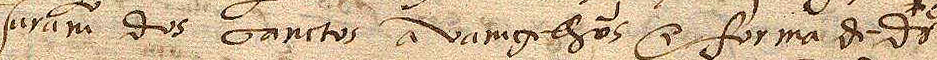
Juramto dos sanctos avamgelhos e̅ forma de drto
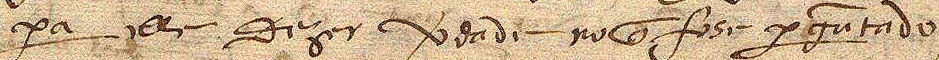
ꝑa elle dezer ꝟdade no q̅ fose ꝑ g̅utado
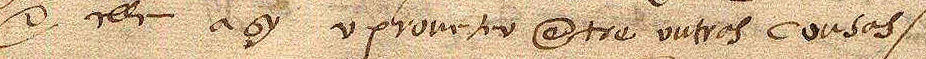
e elle asy o prometeo e̅tre outras cousas /
